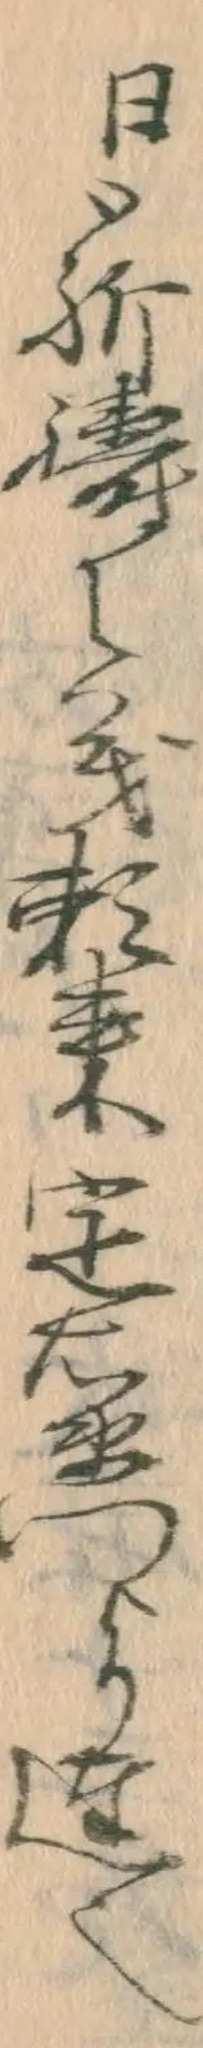日御祈祷之義頼来定右衛門より達也
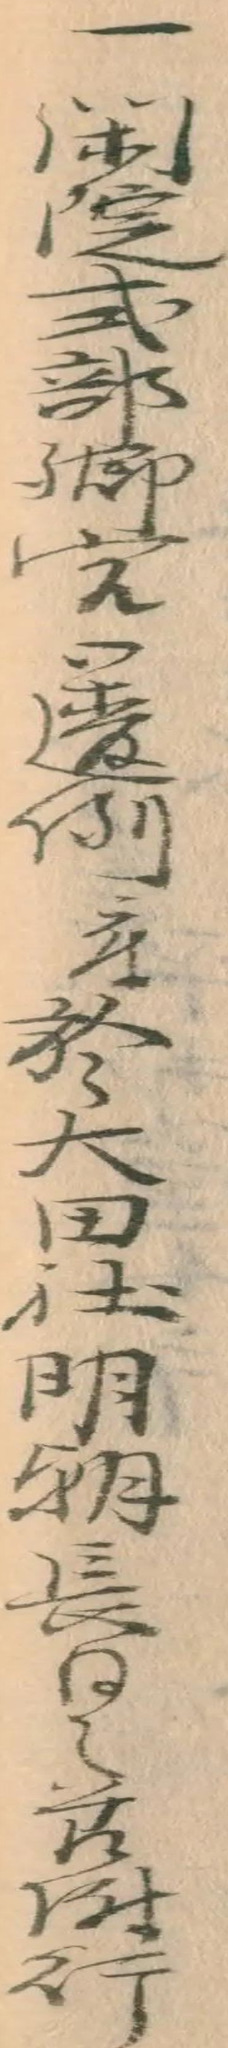一閑院式部卿宮御違例ニ付於大田社明朝長日之節附行
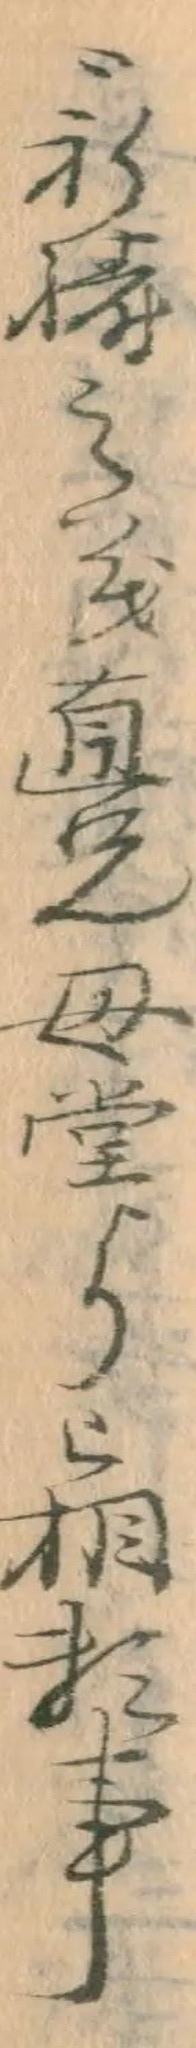御祈祷之義直兄母堂より被相頼事
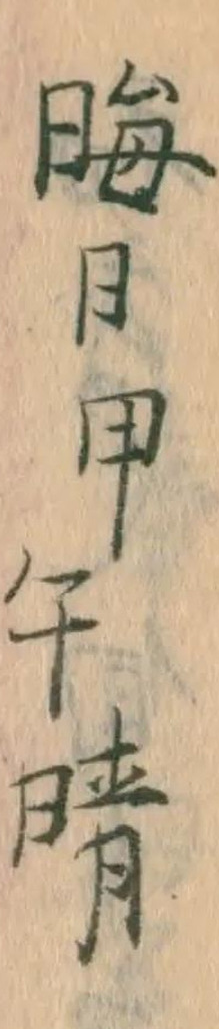晦日甲干晴
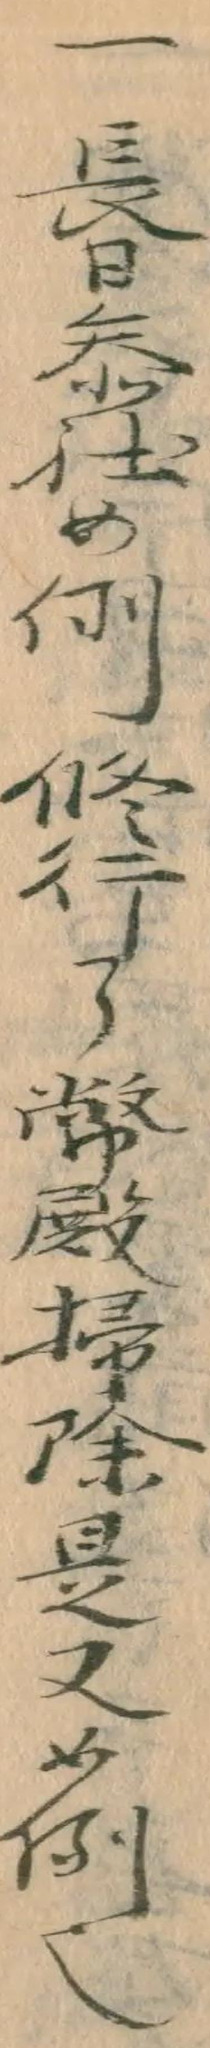一長日参社如例修行了幣殿掃除是又如例也
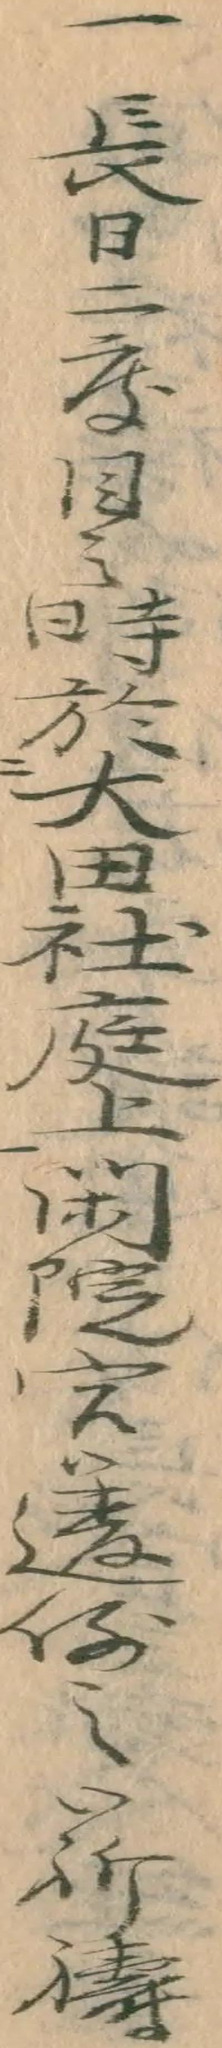一長日二度目之時於大田社庭上閑院宮御違例之御祈祷
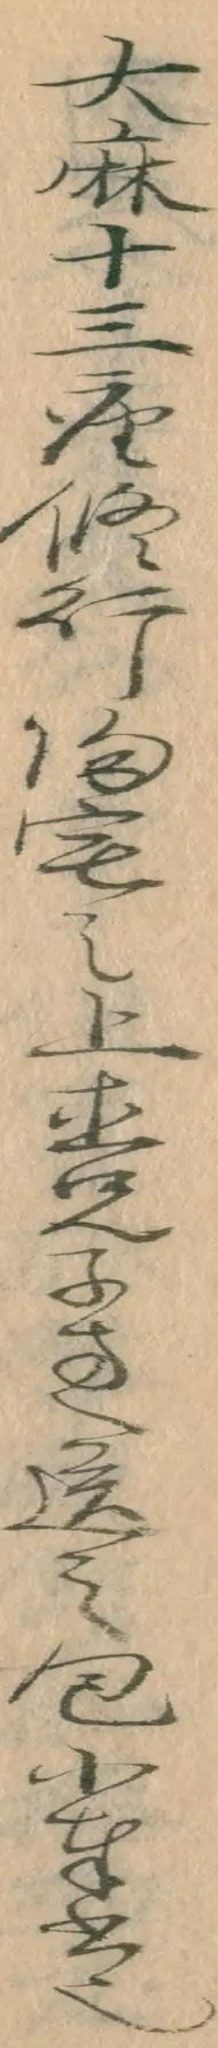大麻十三座修行帰宅之上直兄子方へ送之包小奉書也
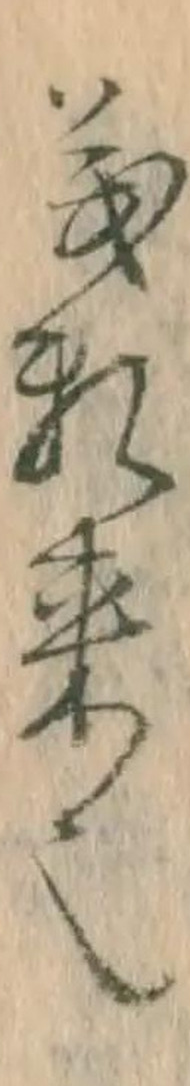義頼来也
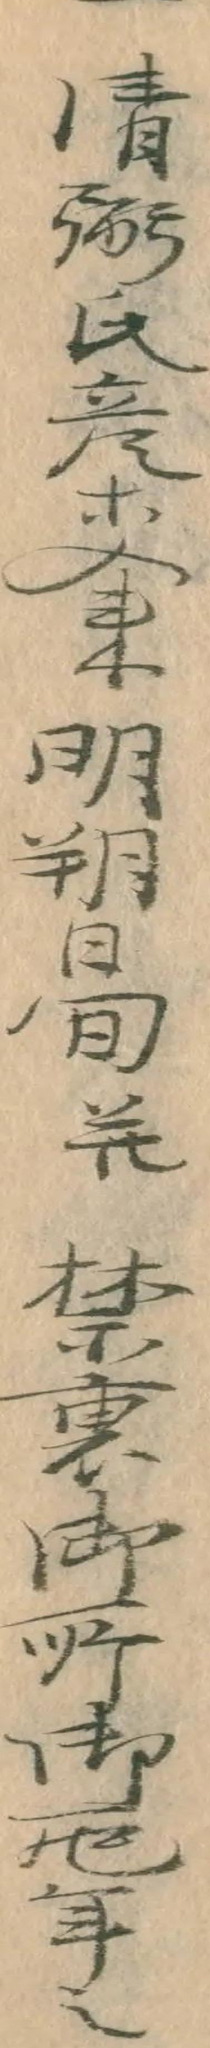一清弼氏彦等入来明朔日旬并禁裏御所御厄年之
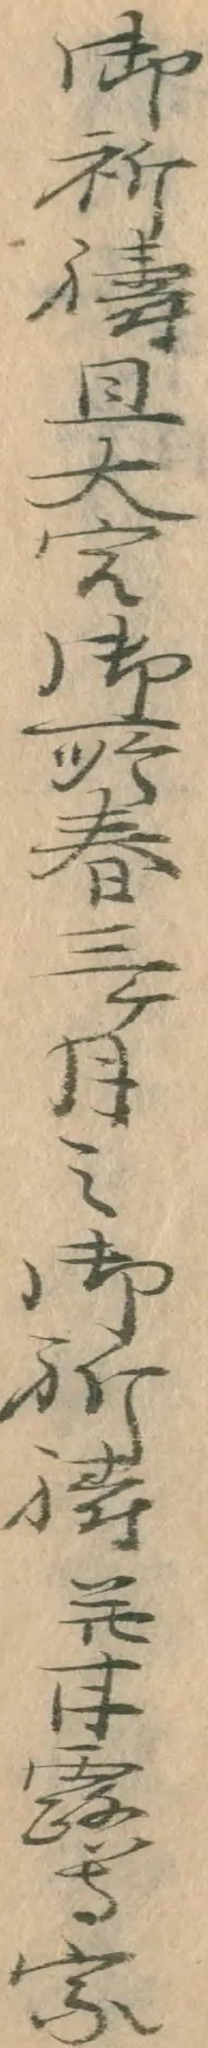御祈祷且大宮御所春三ヶ月之御祈禱并甘露寺家
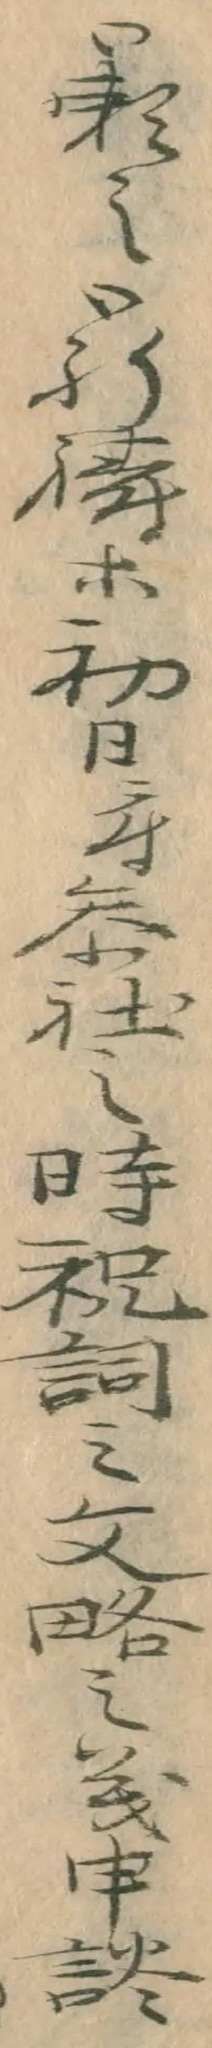御頼之御祈祷等初日ニ付参社之時祝詞之文略之義申談事

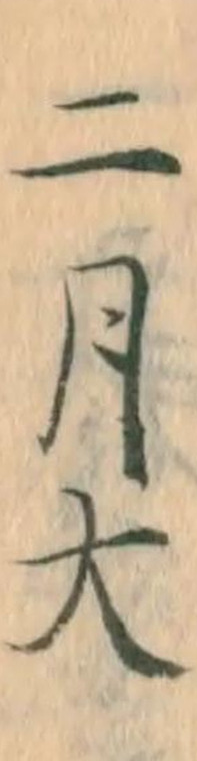二月大
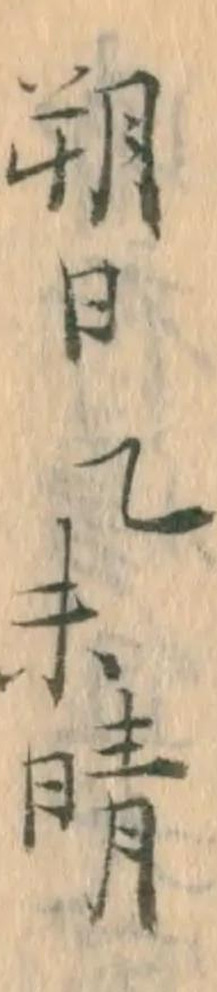朔日乙未晴
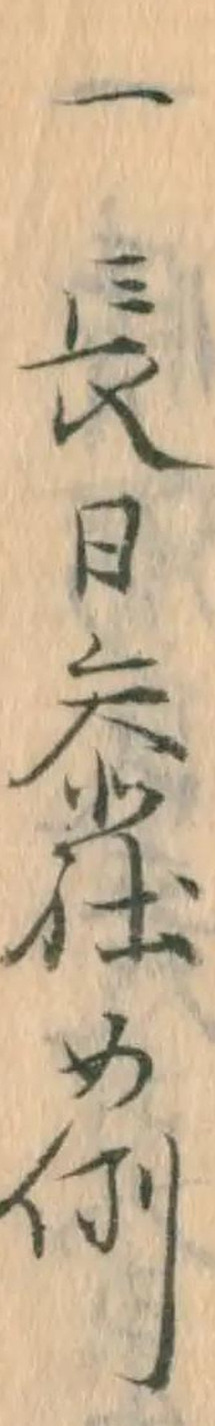一長日参社如例
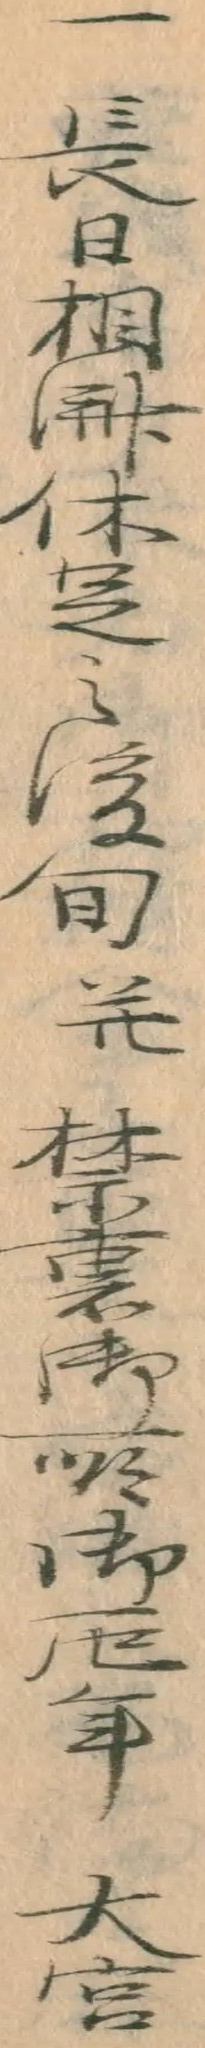一長日相済休足之後旬并禁裏御所御厄年大宮
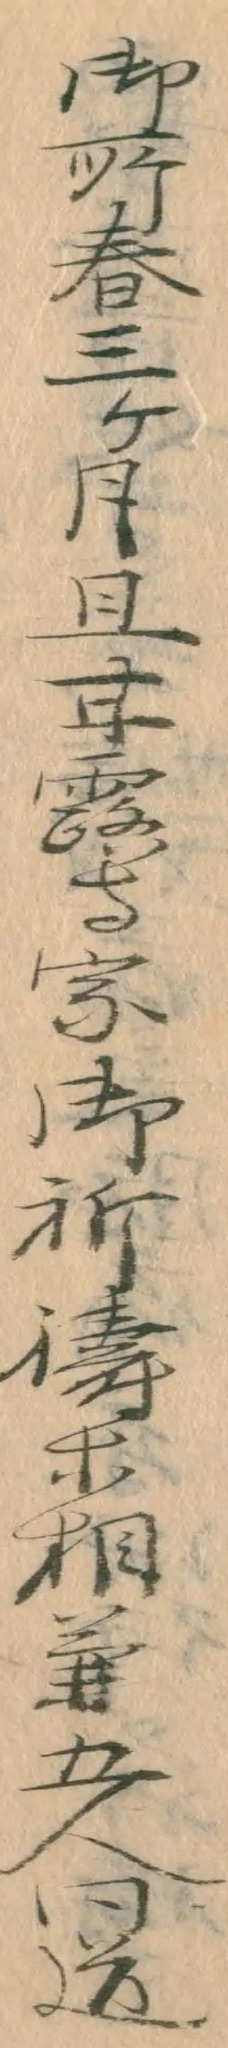御所春三ケ月且甘露寺家御祈祷等相兼五人同道
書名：賀茂社記録. 第72冊
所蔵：国立国会図書館 National Diet Library, JAPAN
